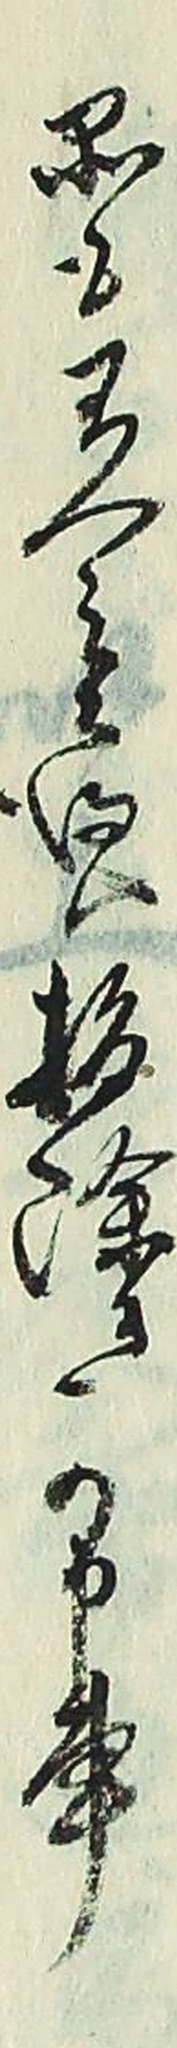品も有之候得ハ指除き可申事
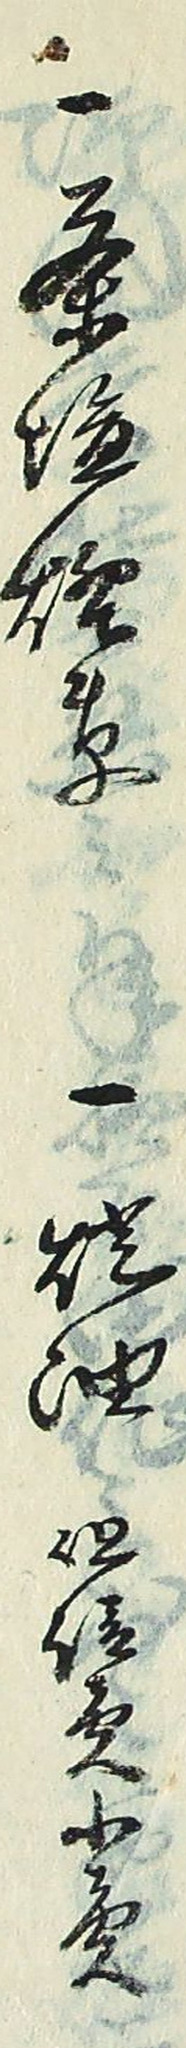一茶塩煙草一燈油但請賣小賣
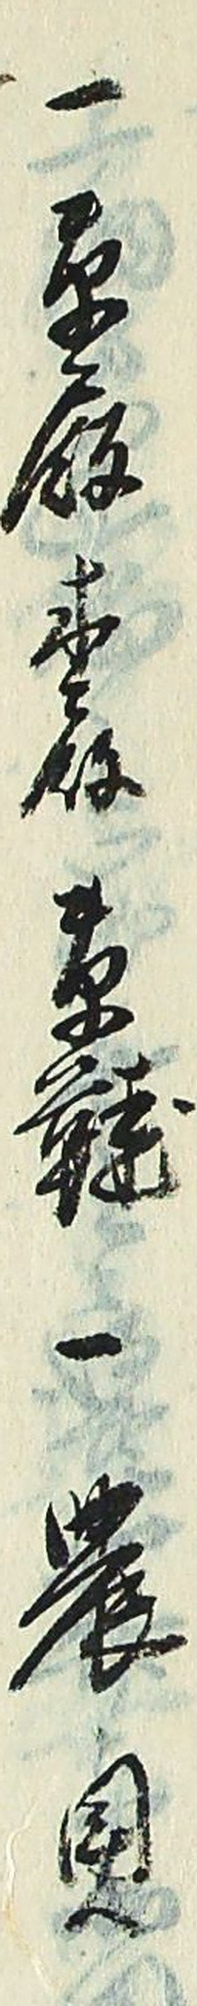一草履木履草鞋一農具
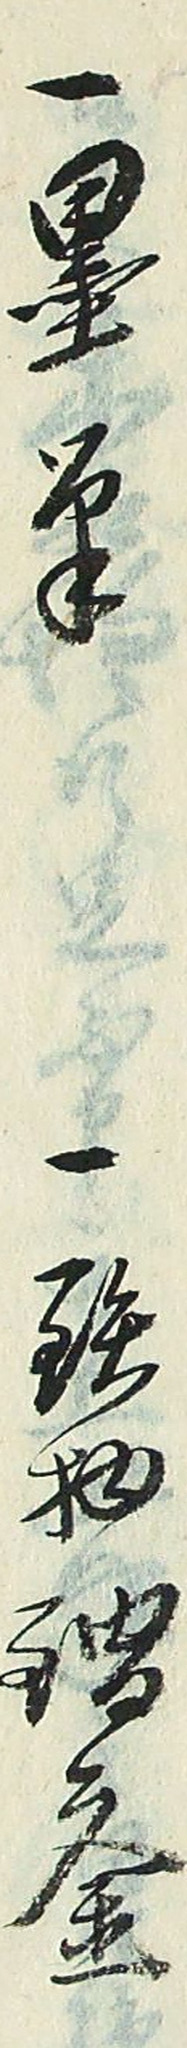一墨筆一鉄物鍋釜

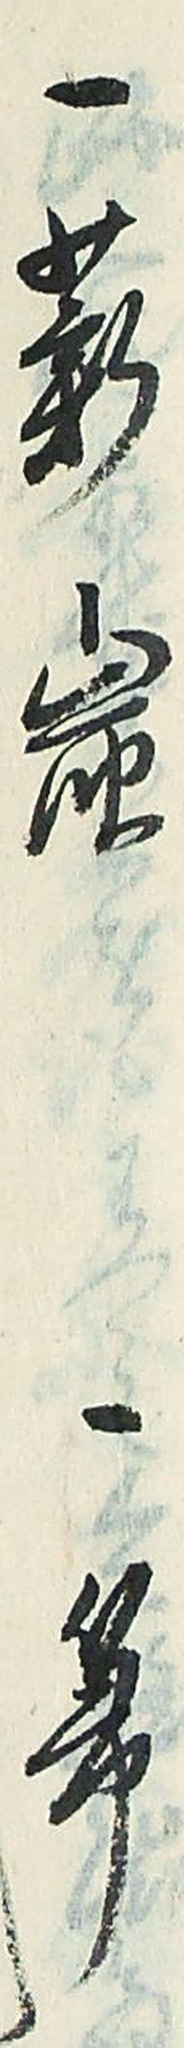一薪炭一箒
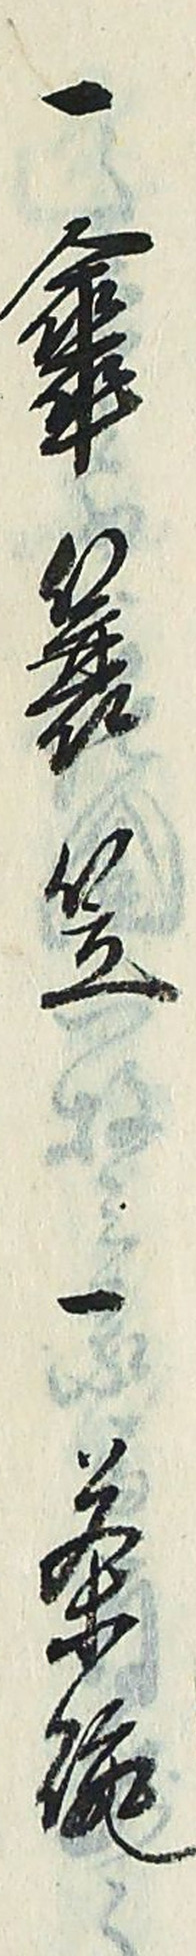一傘蓑笠一茶碗
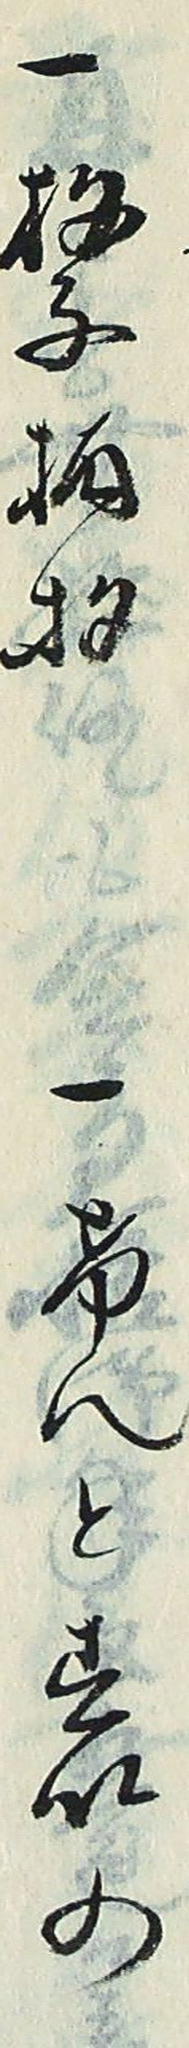一杓子柄杓一けんとすいの？
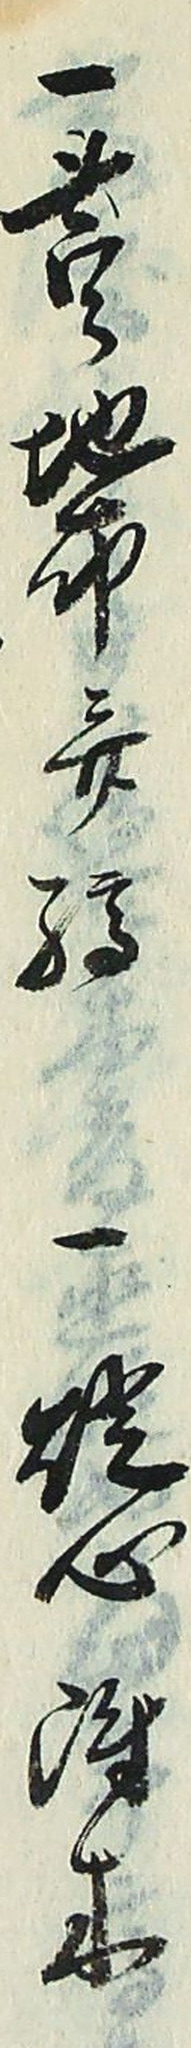一苧地布幷縞一燈心附木
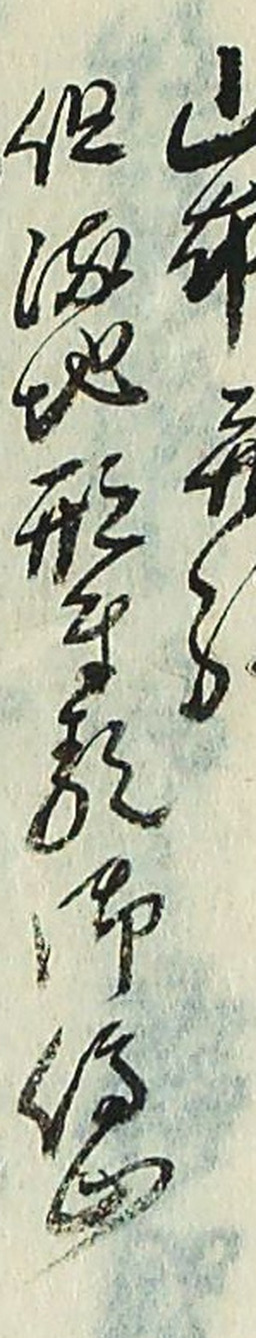但染地形付類御停止
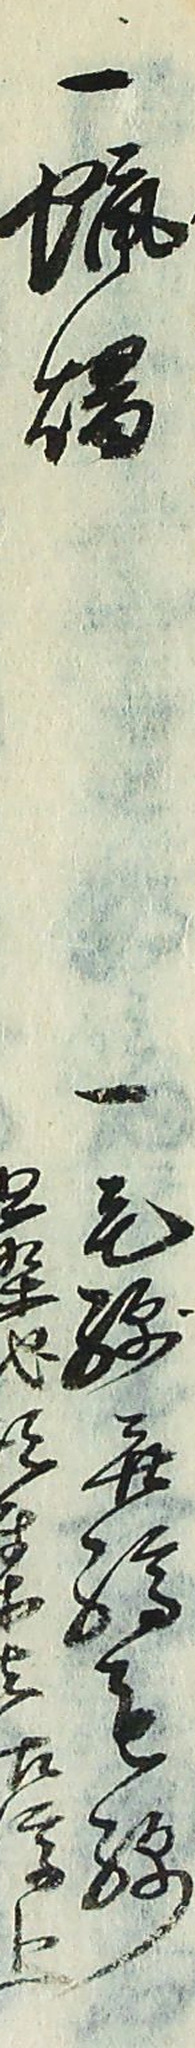一蝋燭一毛綿幷縞毛綿
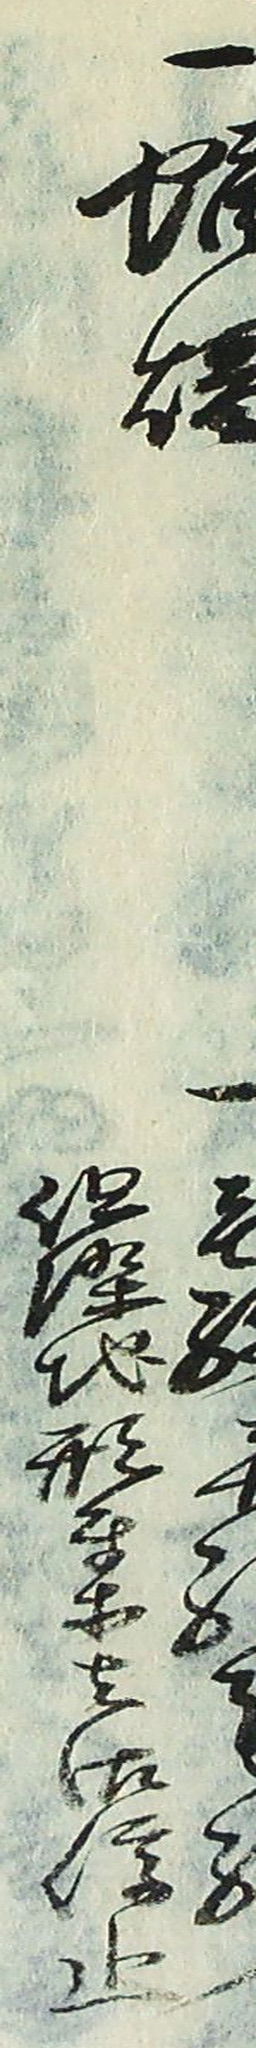但染地形付等者御停止
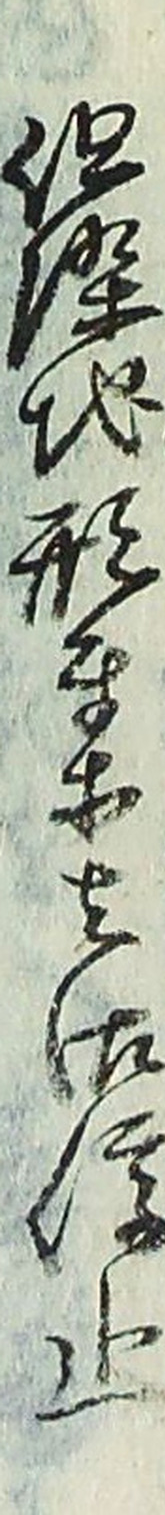但染地形付等者御停止
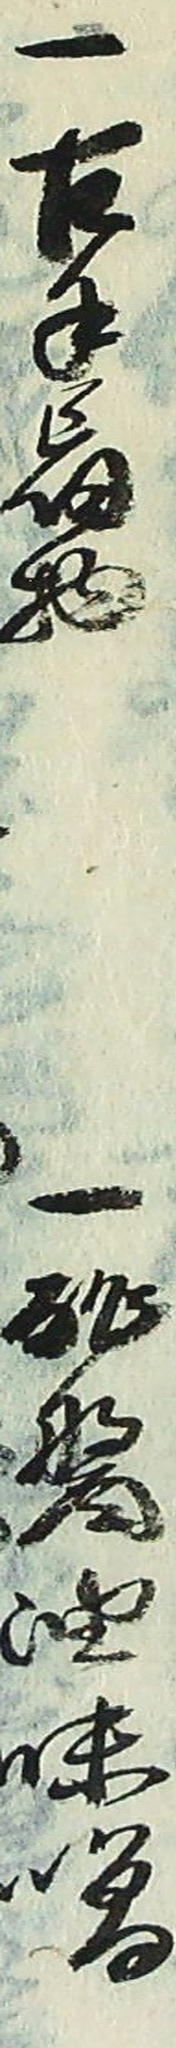一古手着物一酢醤油味噌
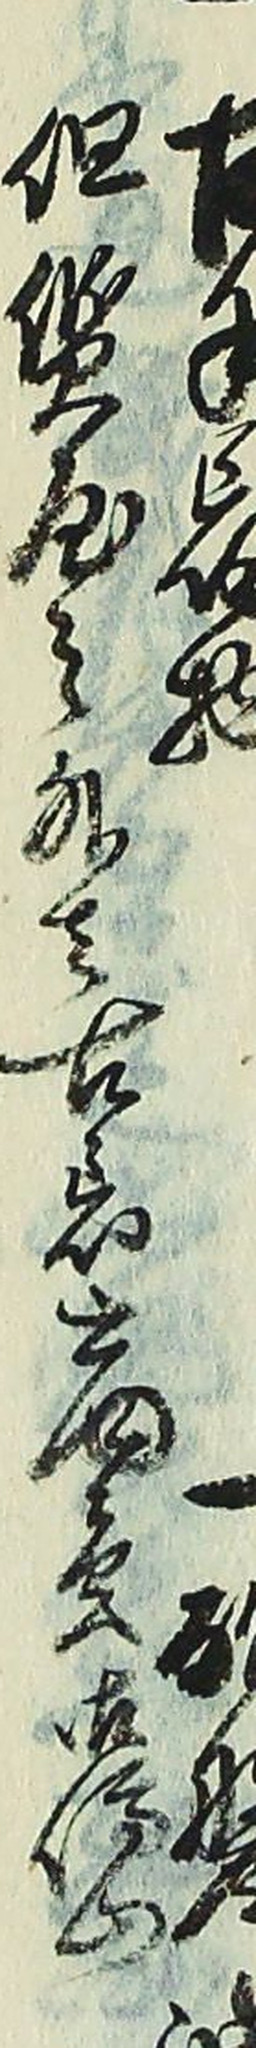但質屋之外者古着商賣御停止
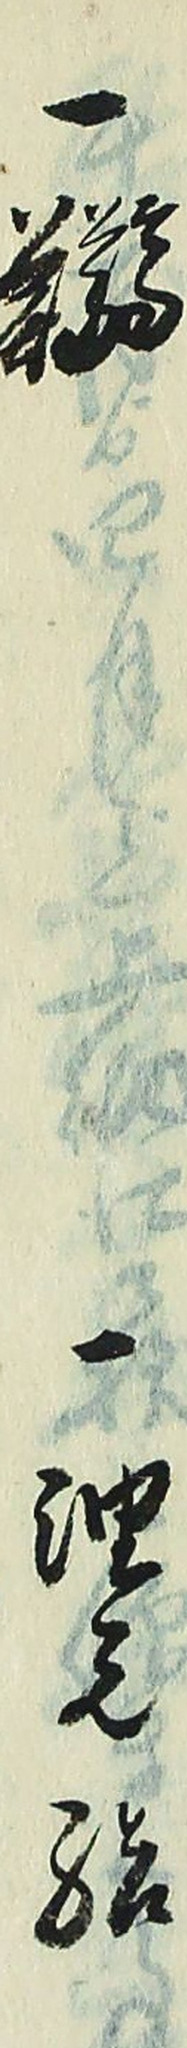一鰯一油元結
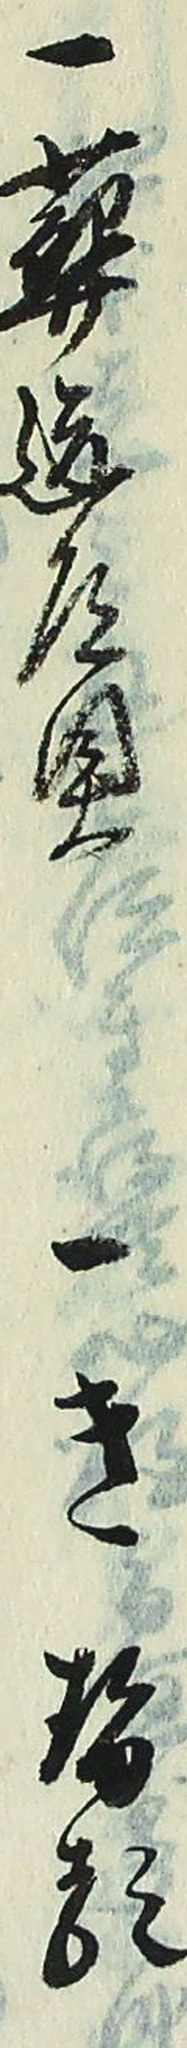一葬送道具一きせる
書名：諸御趣意書并御下知向之写
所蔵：鳴門教育大学 Naruto University of Education
